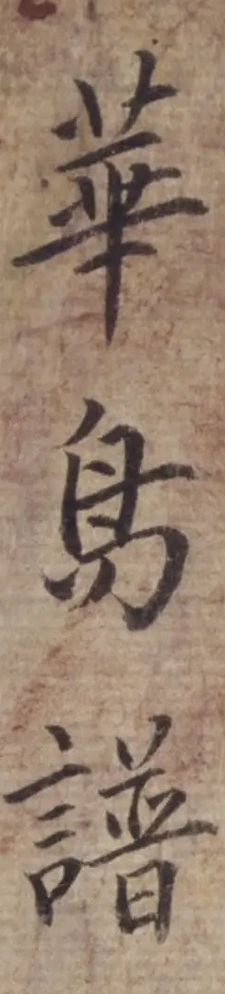華鳥譜

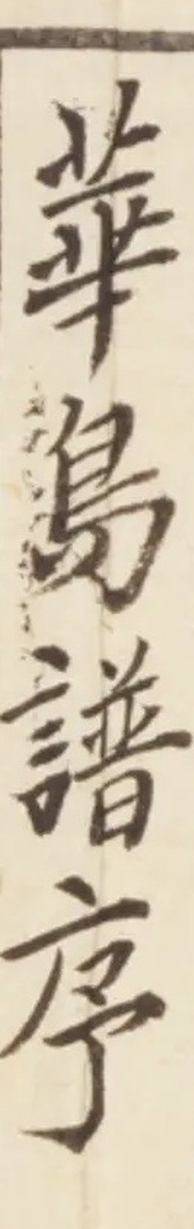華鳥譜序
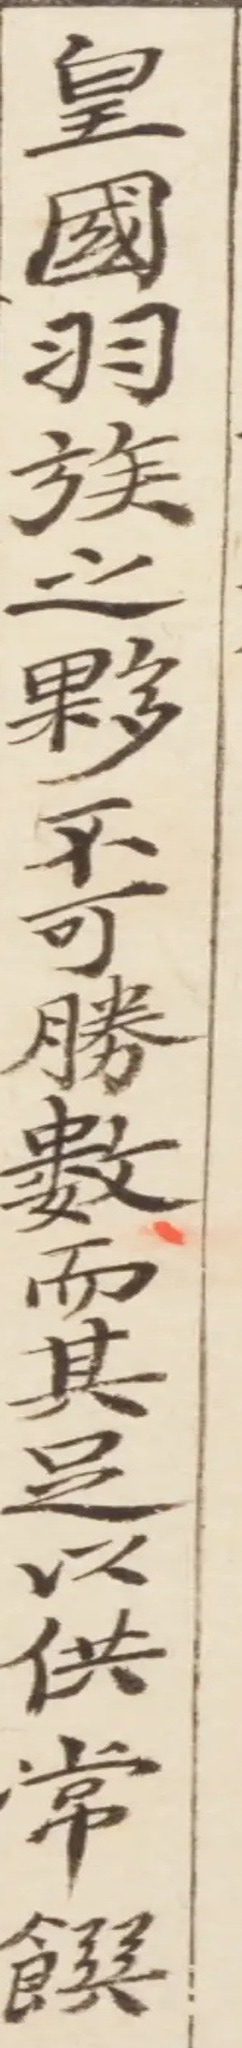皇國羽族之夥不可勝數、而其足以供常饌
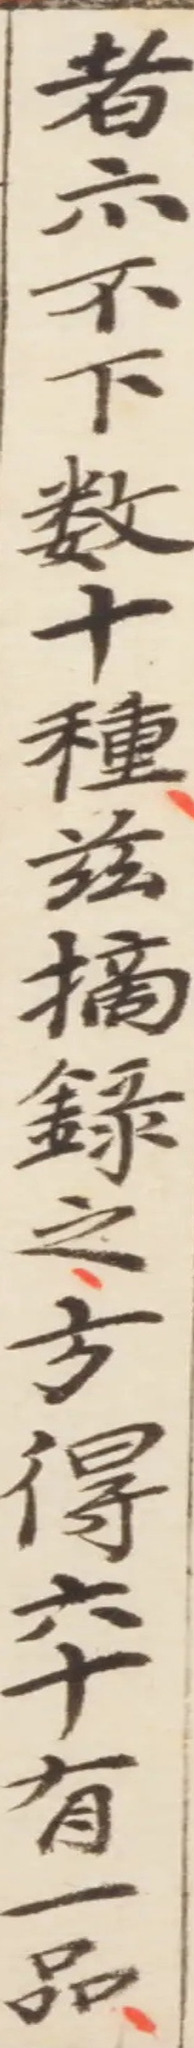者亦不下数十種、兹摘録之、方得六十有一品、
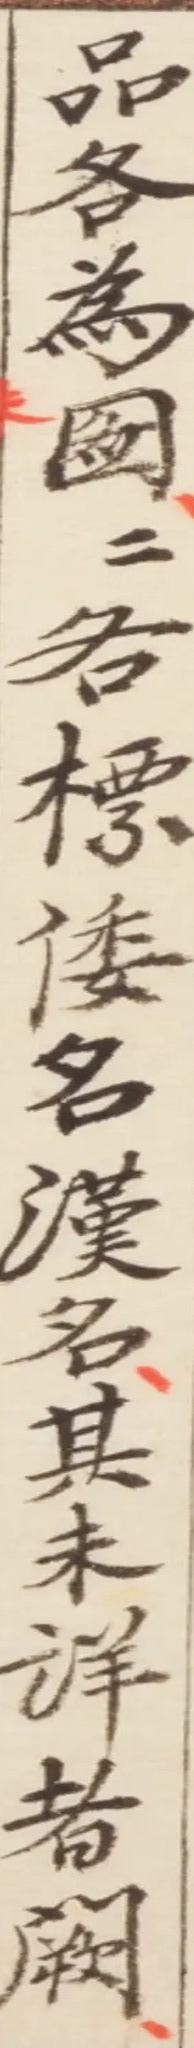品各為圖、各標倭名漢名、其未詳者闕、
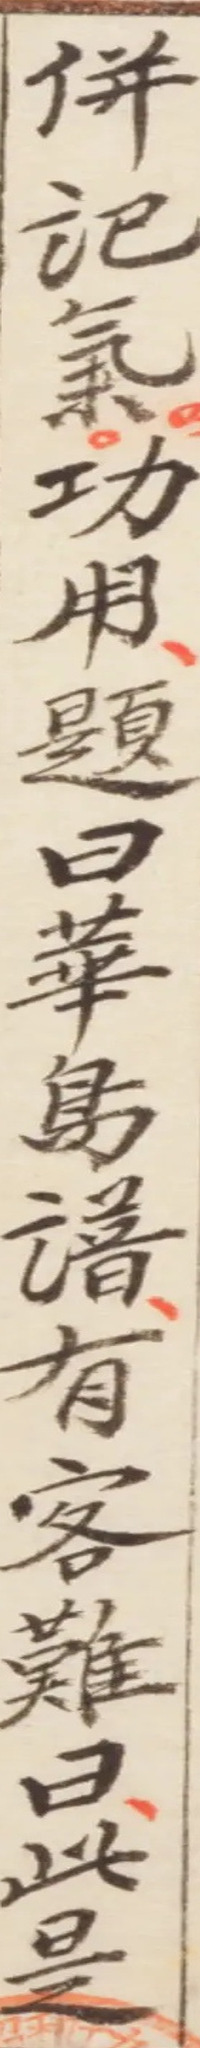併記氣◦功用、題曰華鳥譜、有客難曰、此是
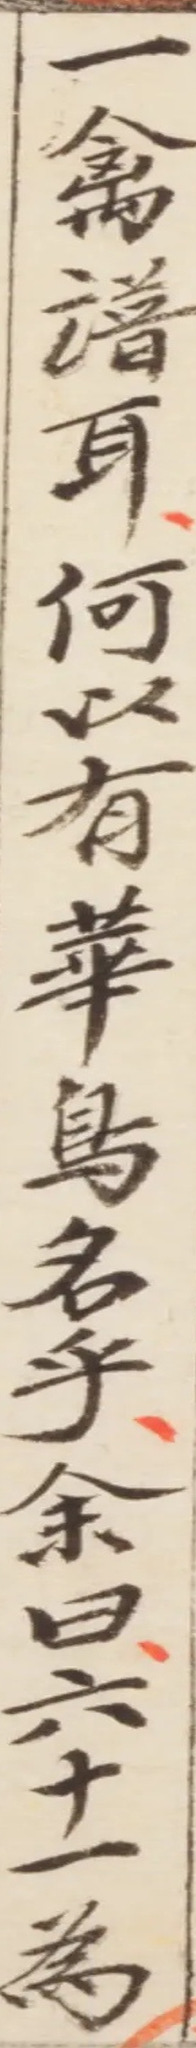一禽譜耳、何以有華鳥名乎、余曰、六十一為
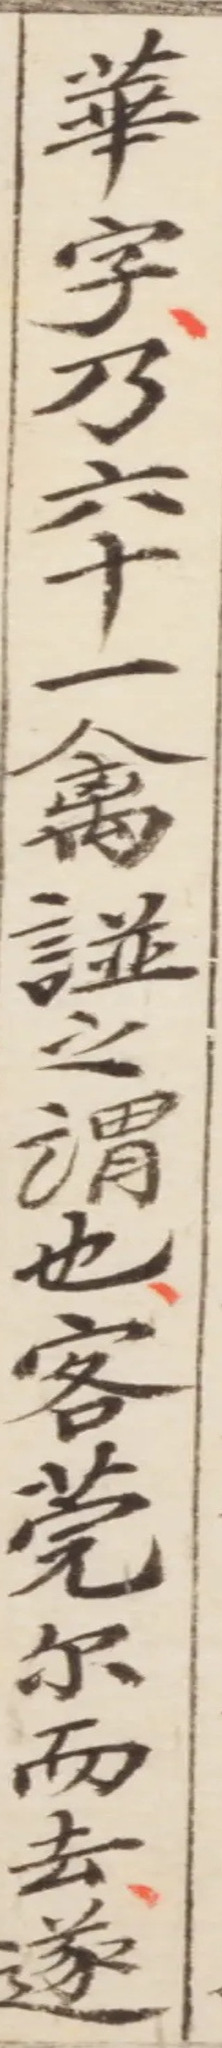華字、乃六十一禽諩之謂也、客莞尔而去、遂
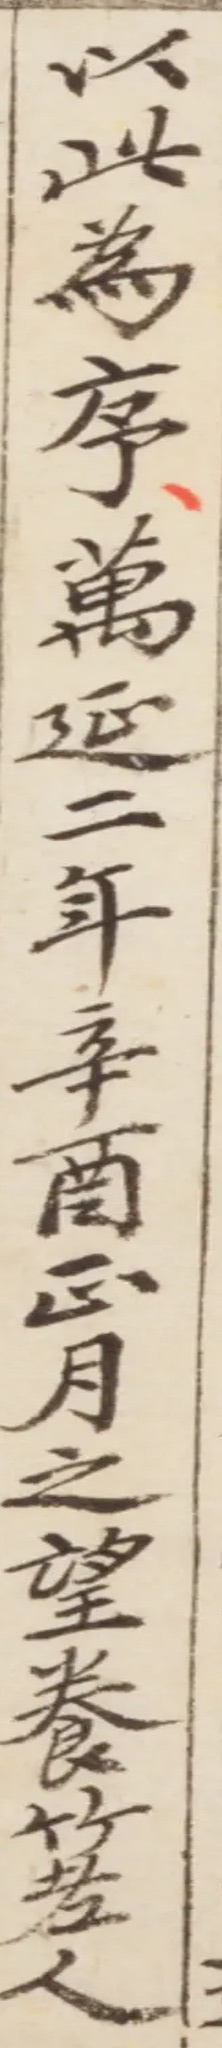以此為序、萬延二年辛酉正月之望養竹老人
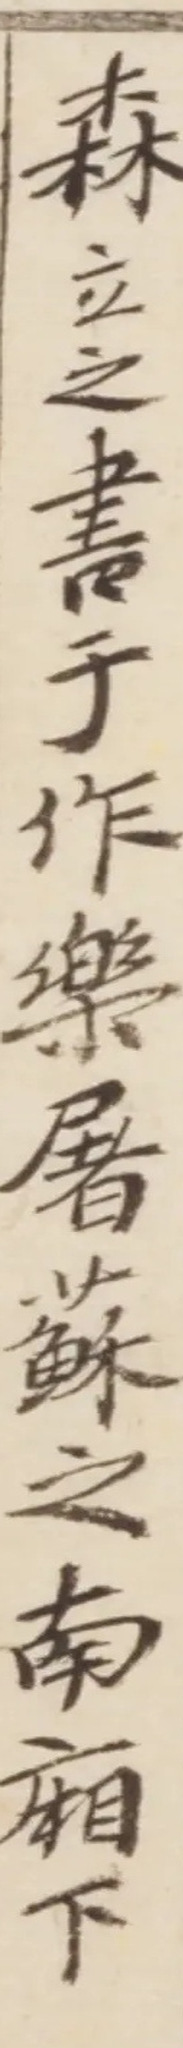森立之書于作樂屠蘇之南廂下

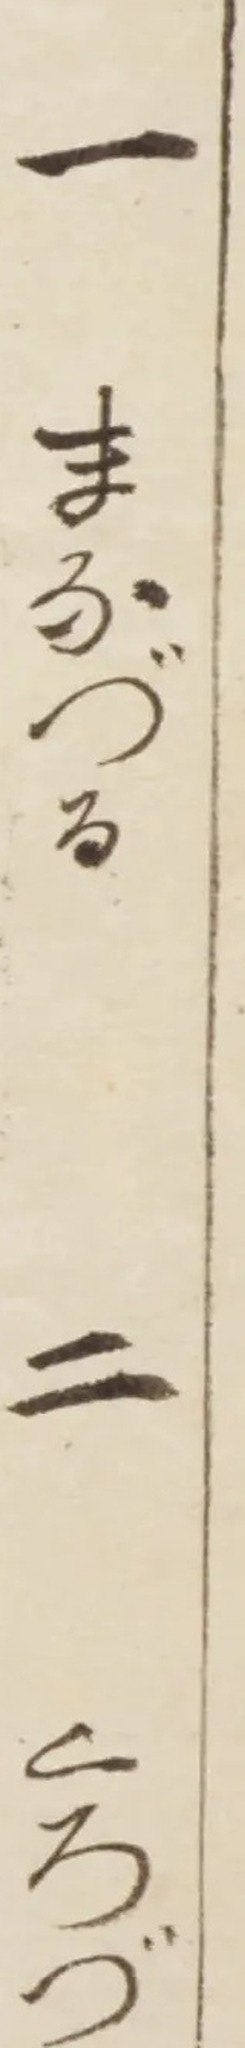一まなづる二くろづる
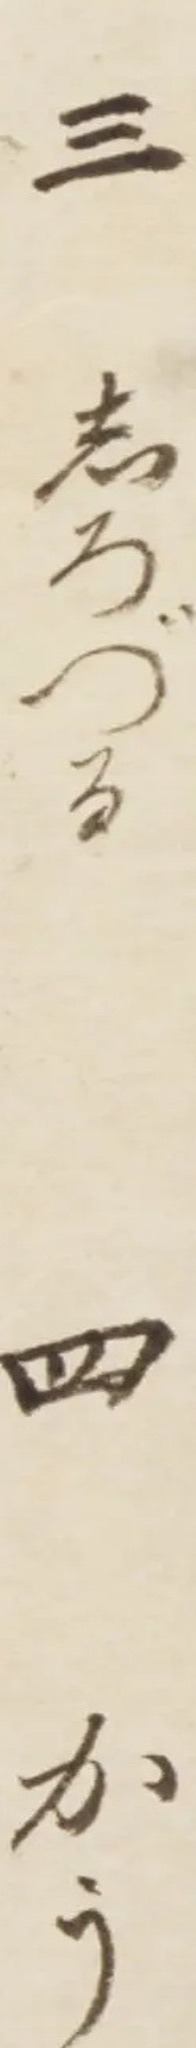三しろづる四かう
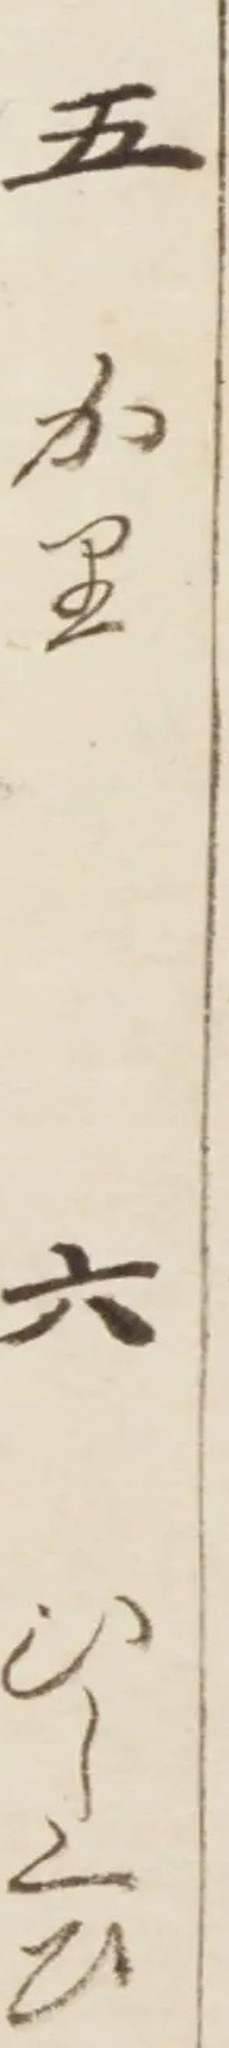五かり六ひしくひ
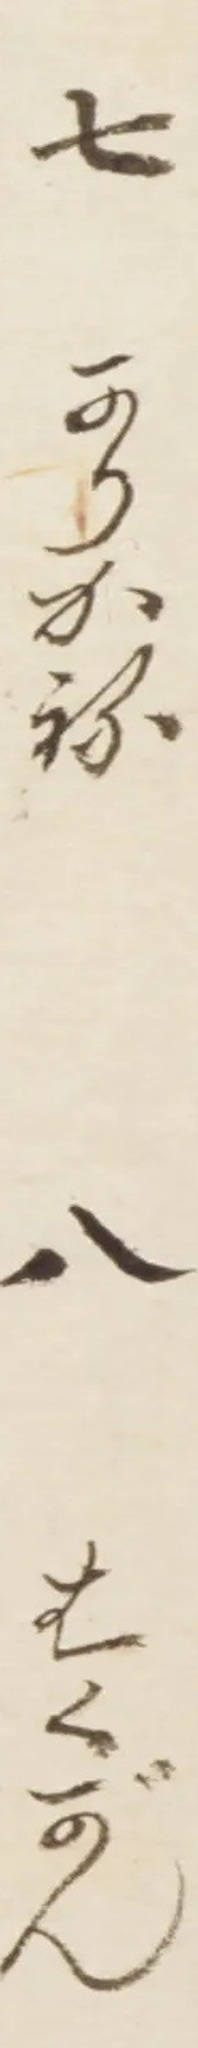七かりかね八はくがん
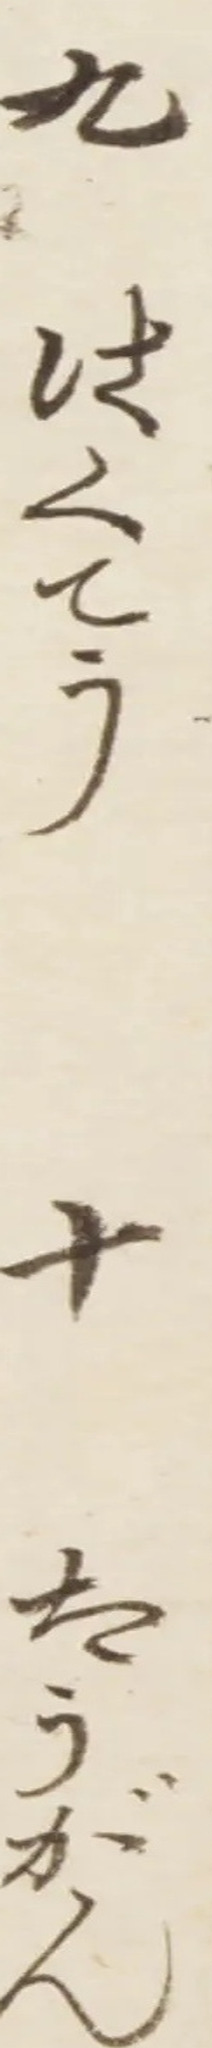九はくてう十たうがん
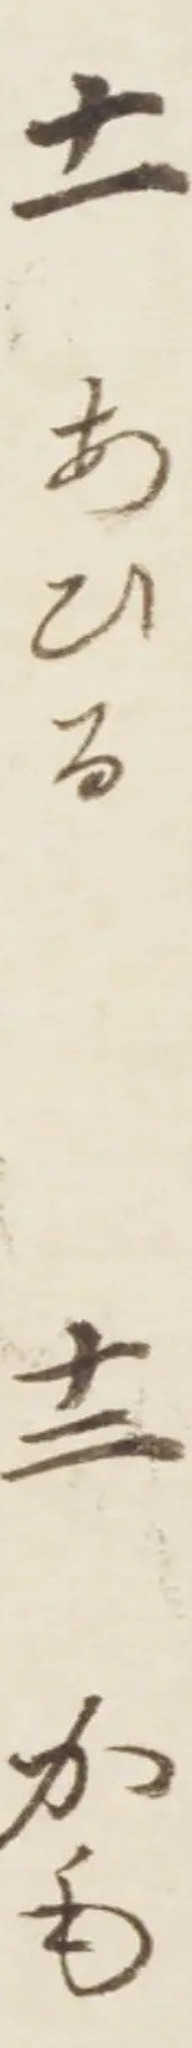十一あひる十二かも
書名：華鳥譜
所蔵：国立国会図書館 National Diet Library, JAPAN
